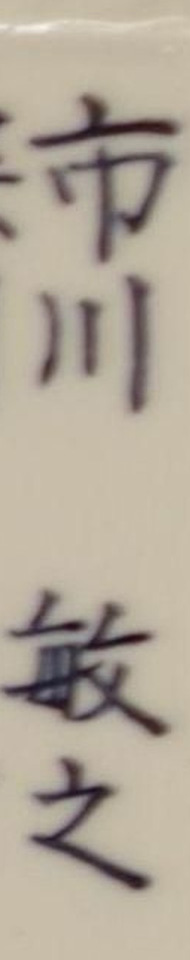市川敏之
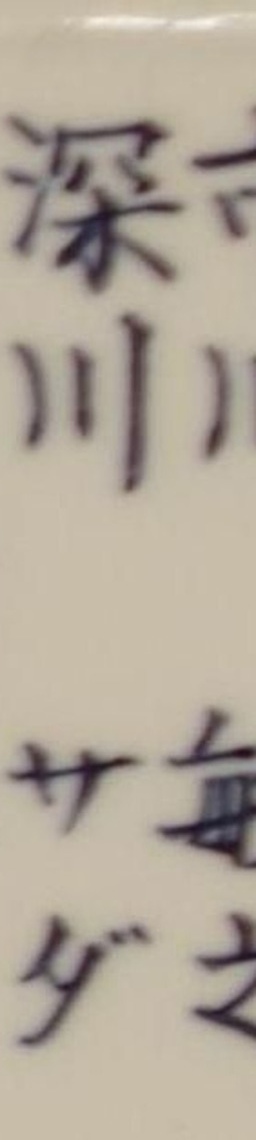深川サダ
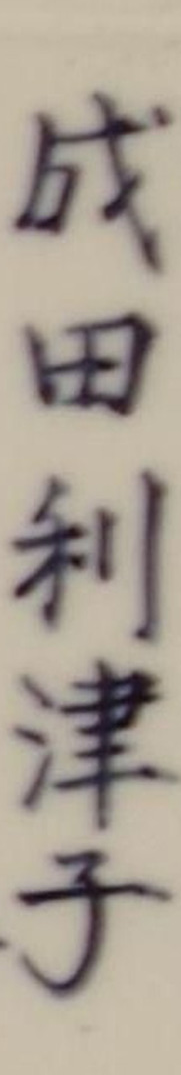成田利津子
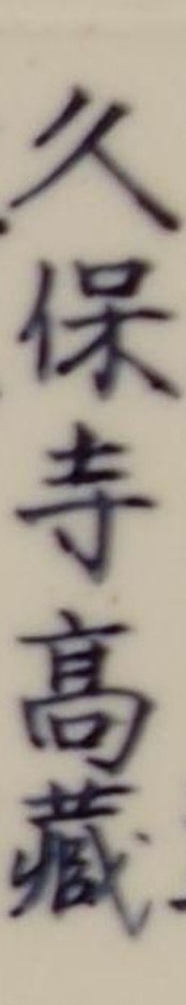久保寺高蔵
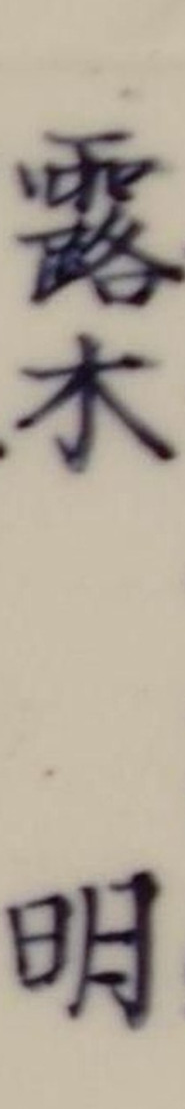露木明
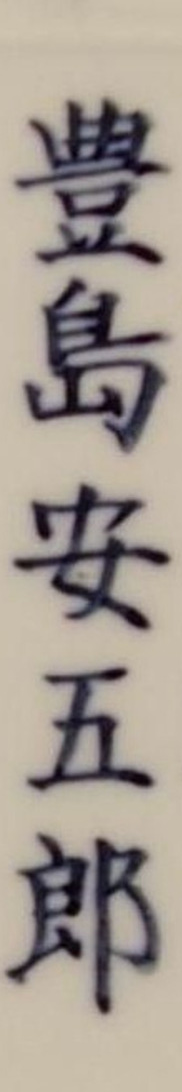豊島安五郎
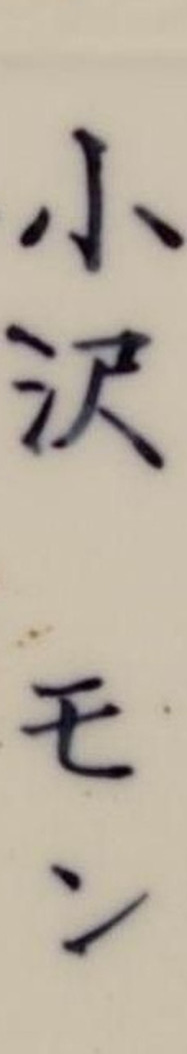小沢モン
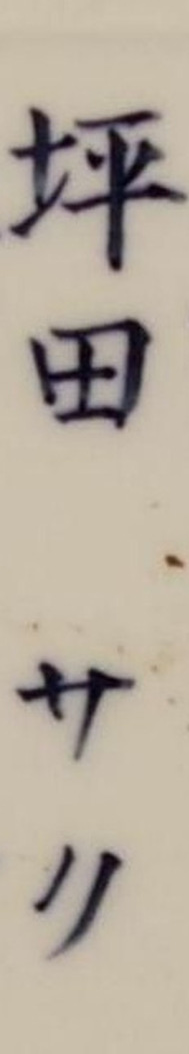坪田サク
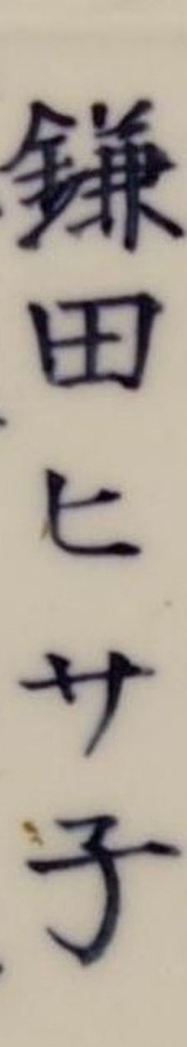鎌田ヒサ子
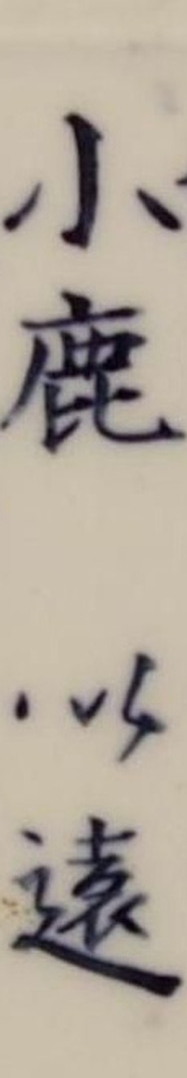小鹿以遠
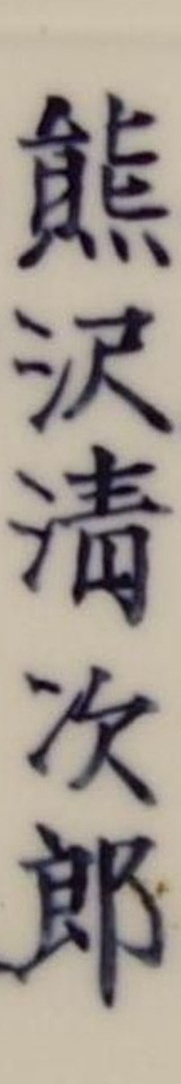熊沢清次郎
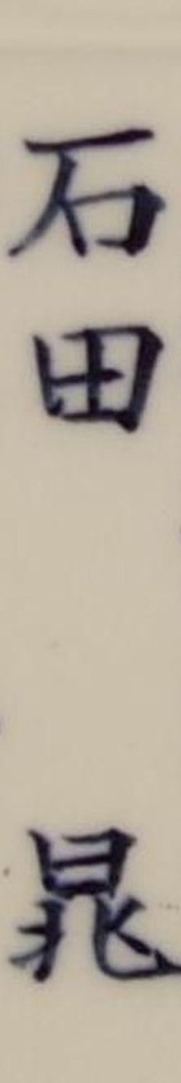石田晁
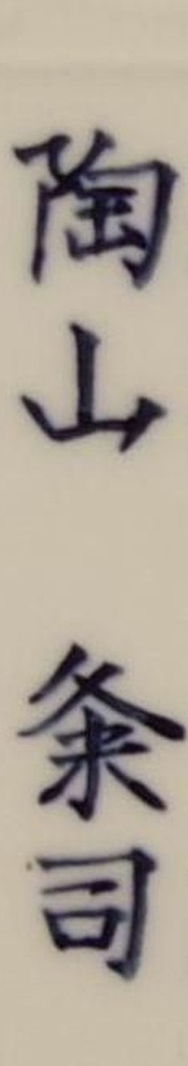陶山条司

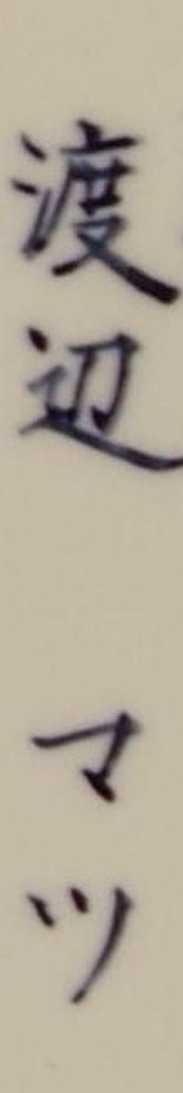渡辺マツ
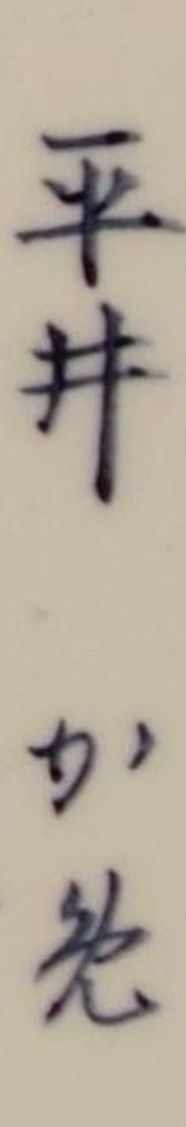平井かめ
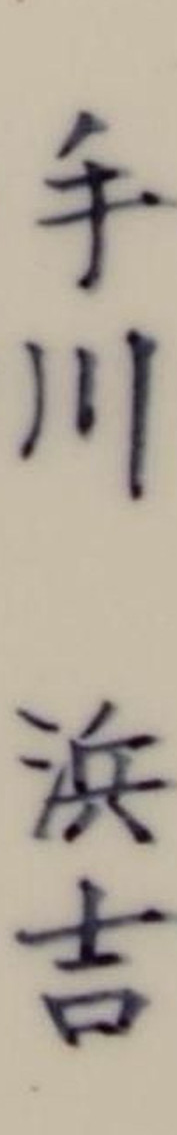手川浜吉
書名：M~S
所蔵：高野山金剛峯寺
